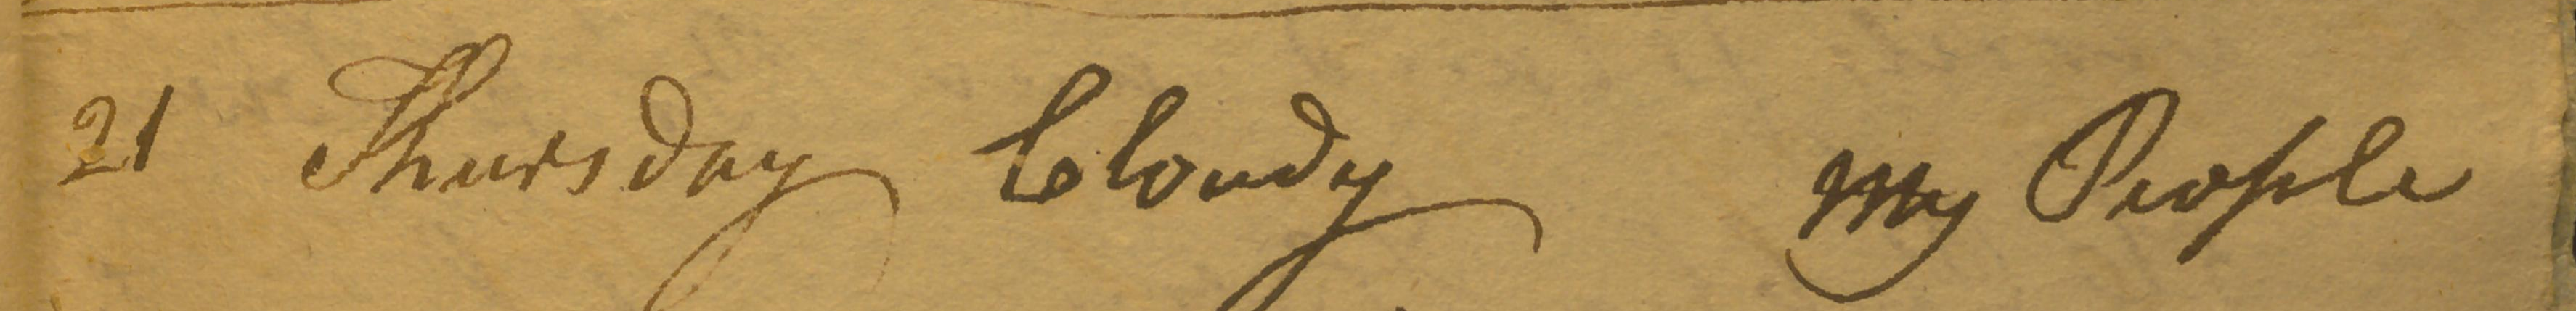21 Thursday Cloudy my People
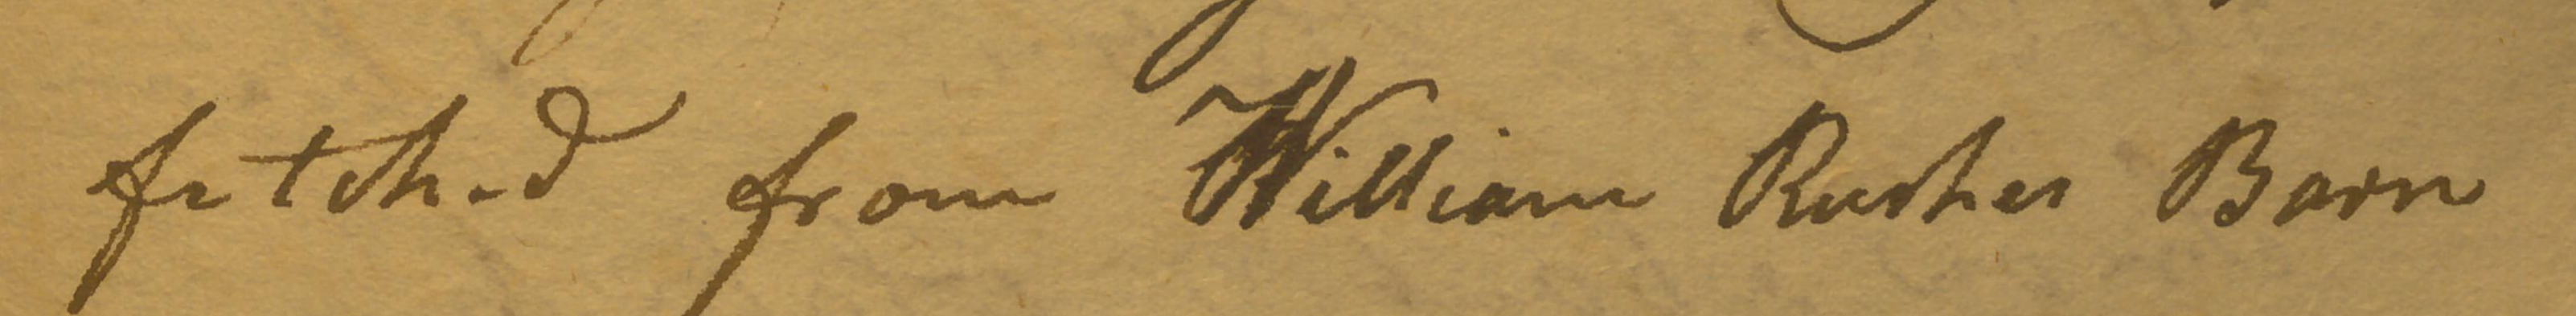fetched from William Rushes Barn
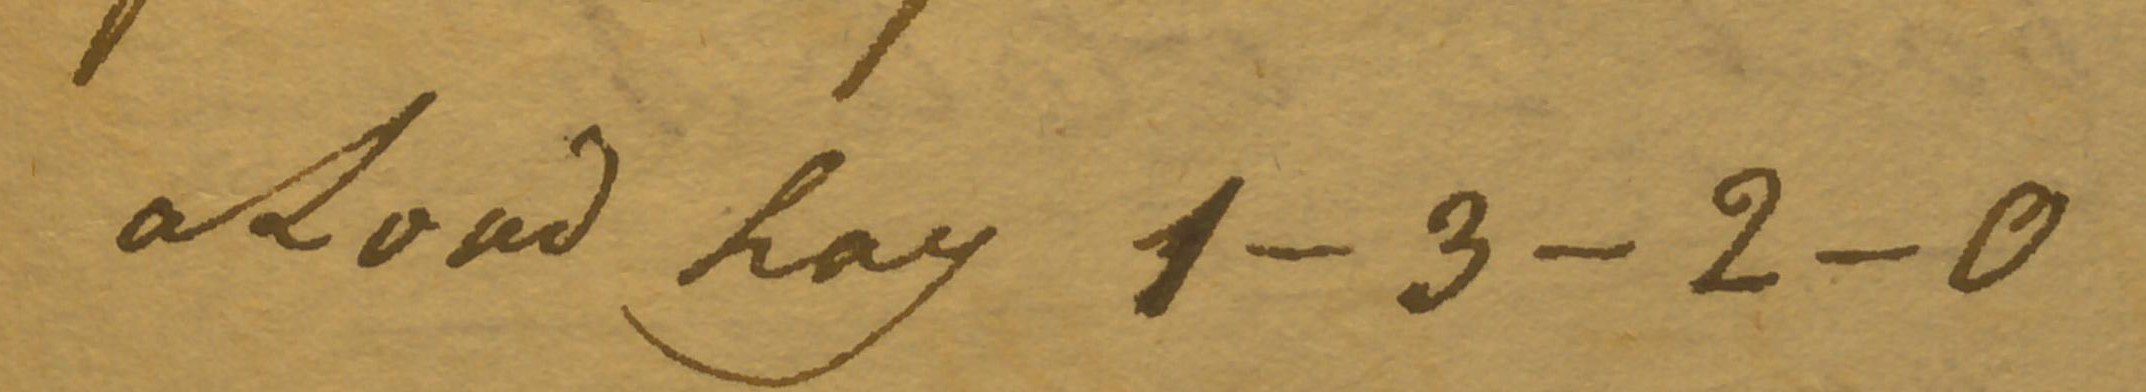a Load hay 1-3-2-0
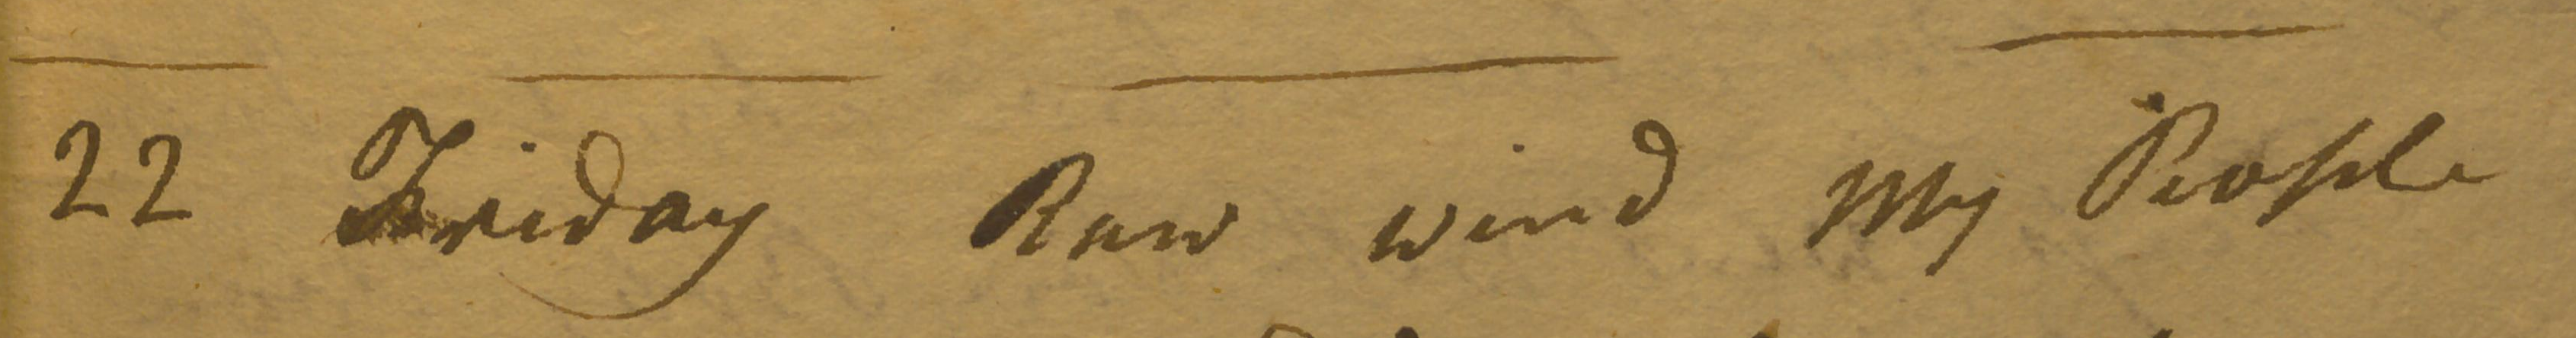22 Friday Raw wind My People
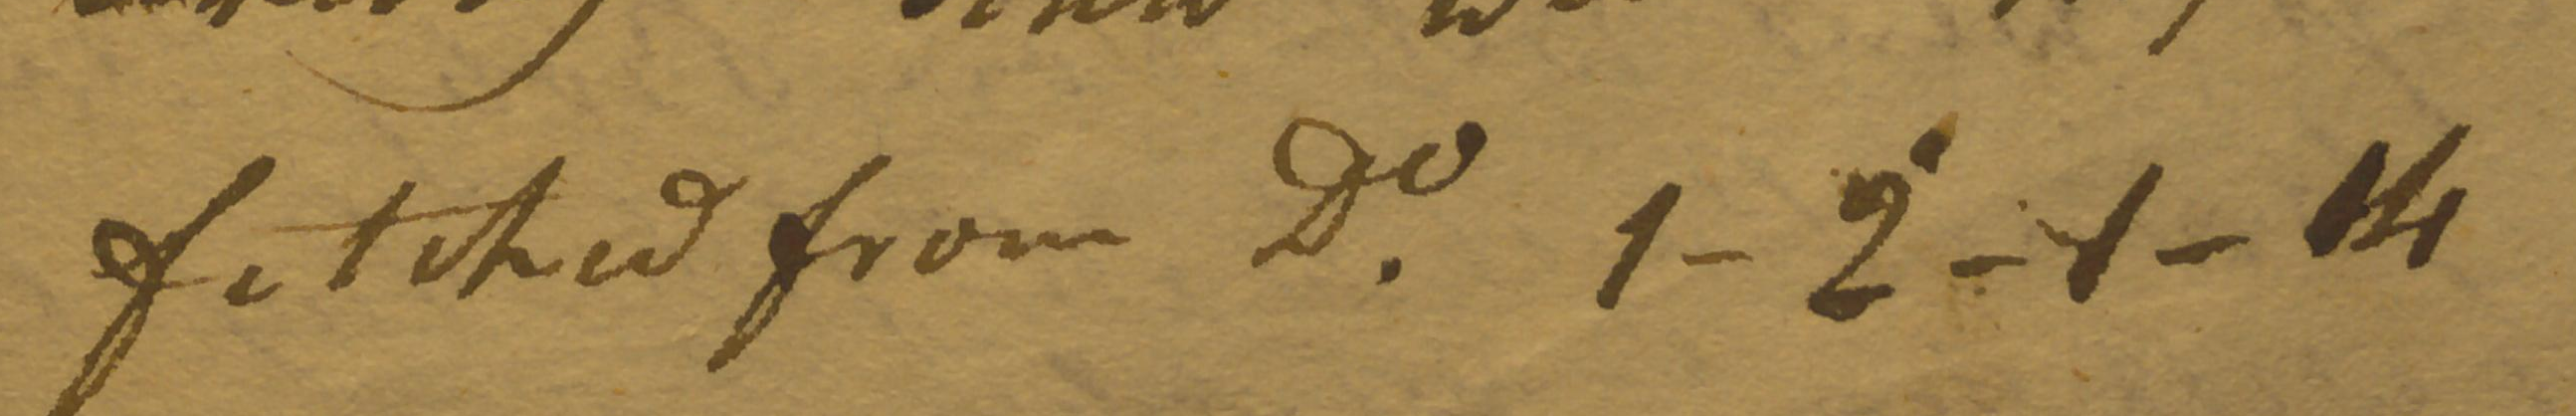fetched from D^o. 1-2-1-14
